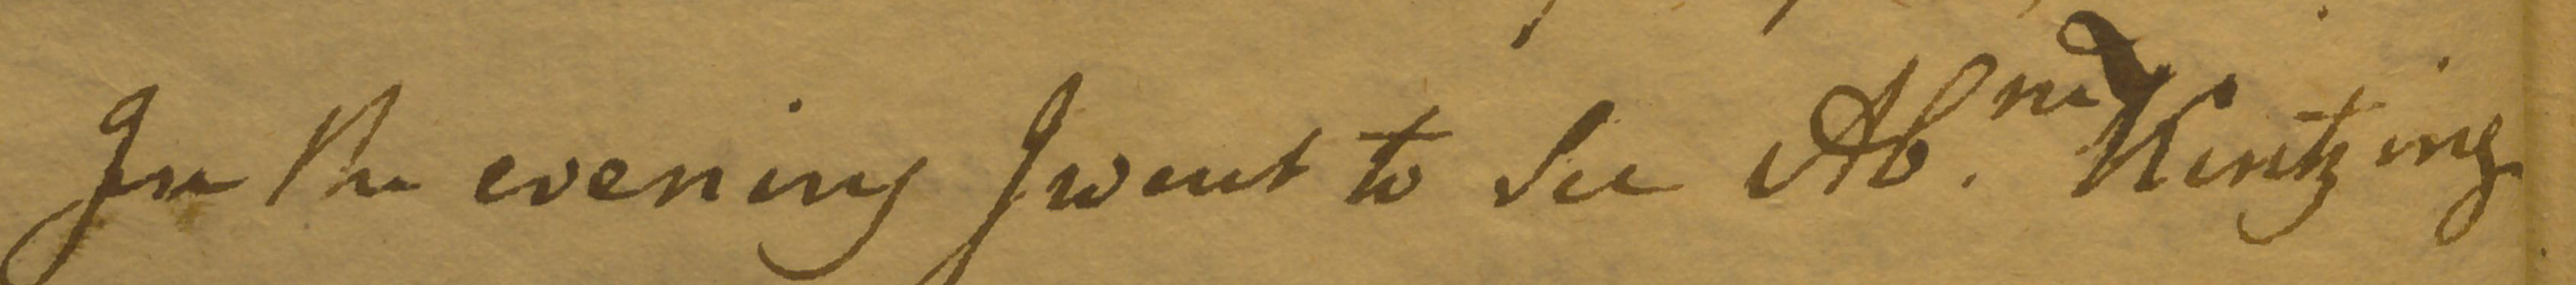In the evening I went to see Ab^m. Kintzing
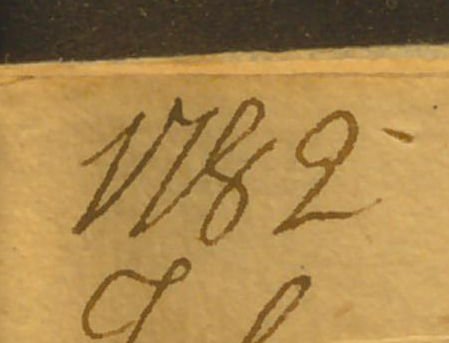1782
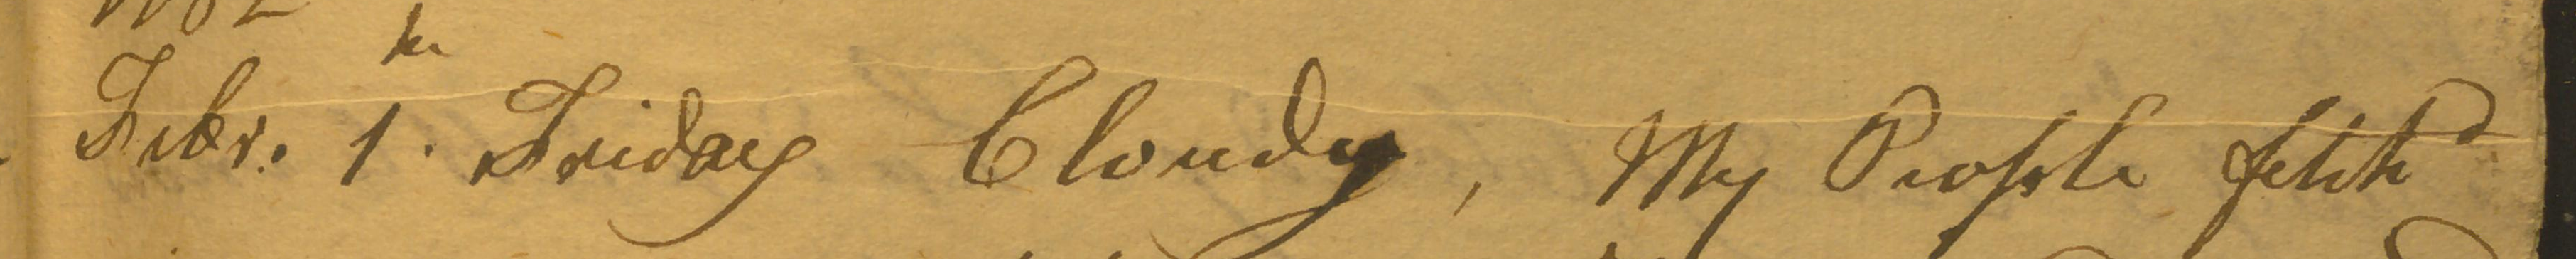Febr. 1^th. Friday Cloudy, My People fetch^l.
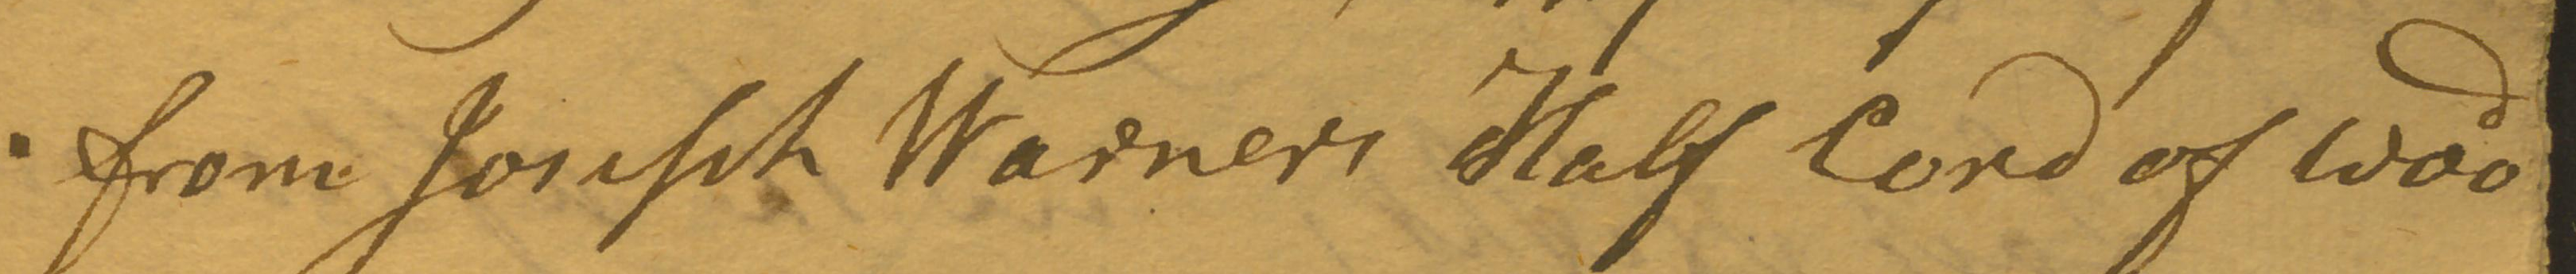from Joseph Warners Half Cord of Woo^d
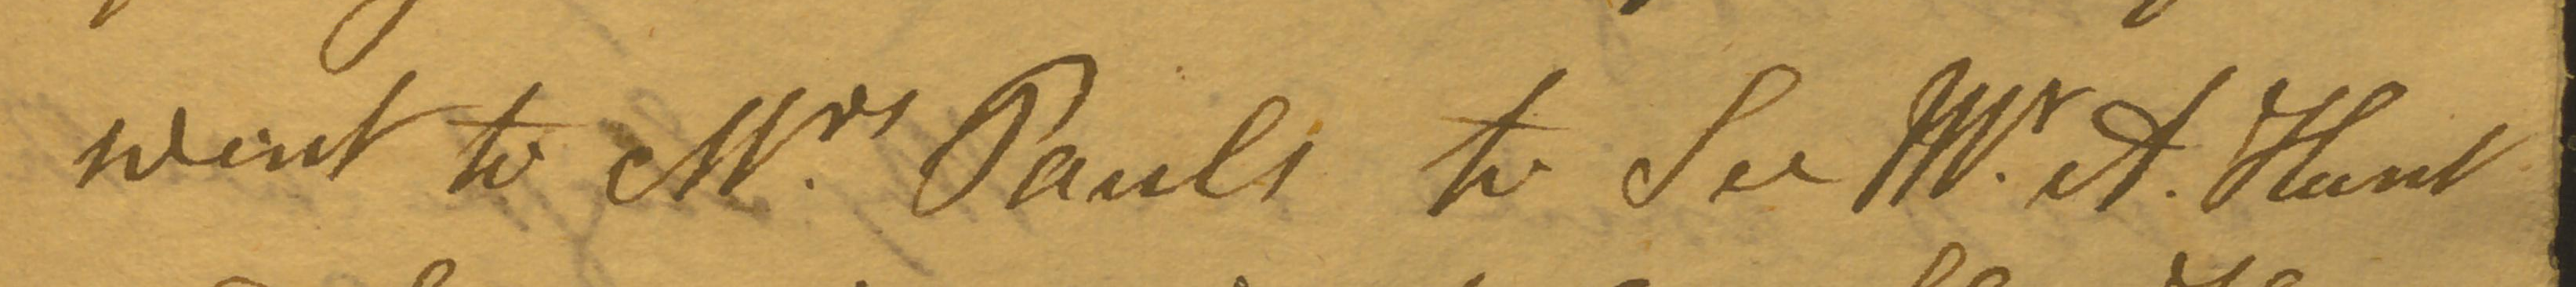went to M^rs. Pauls to see M^r. A. Hunt
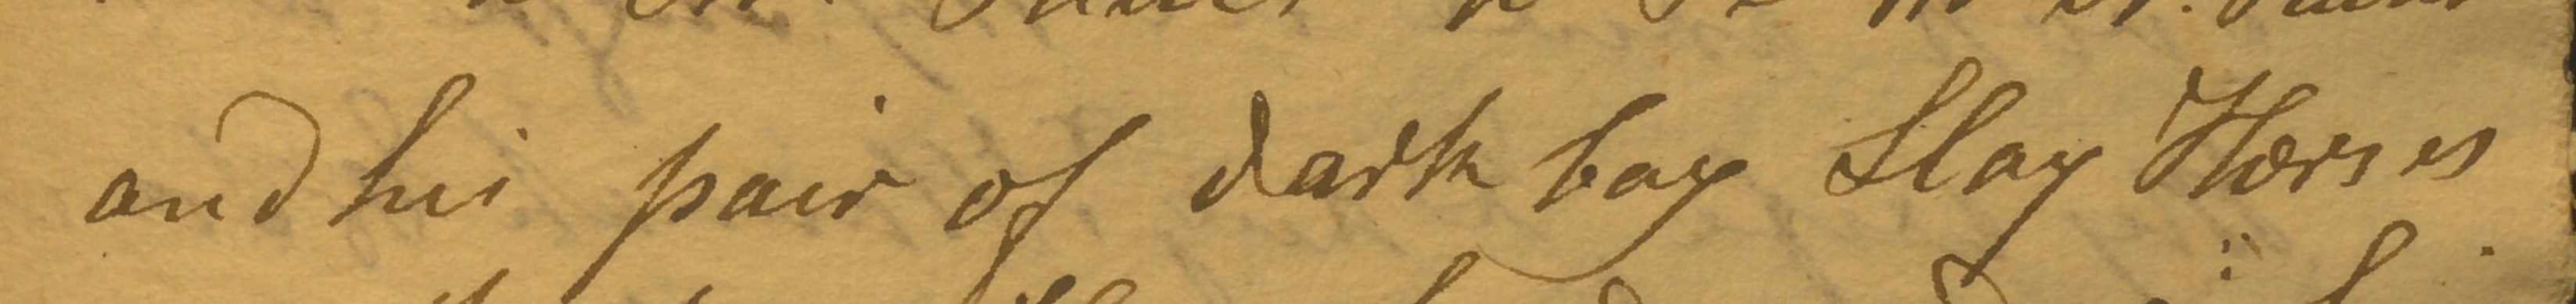and his pair of dark bay Slay Horses
